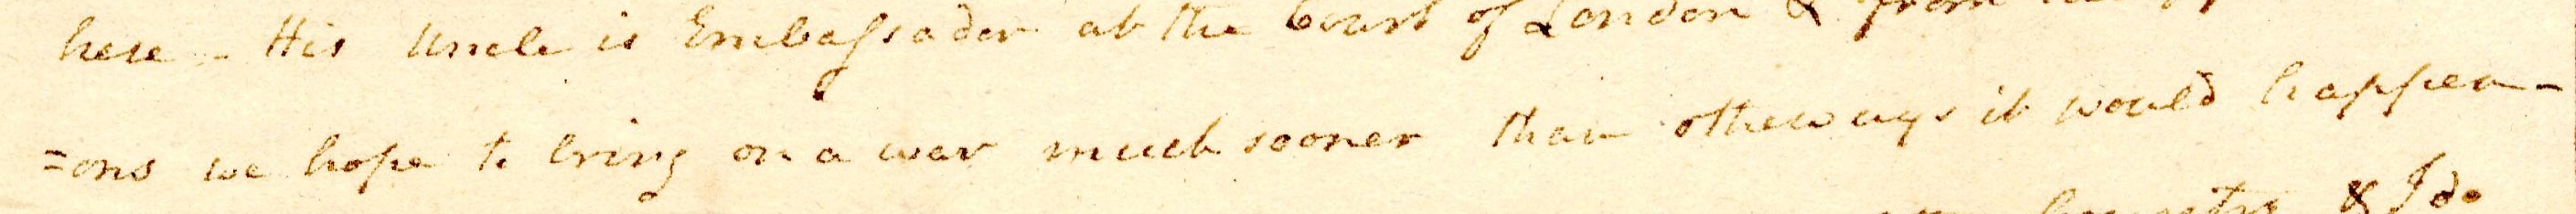-ons we hope to bring on a war much sooner that otherways it would happen-
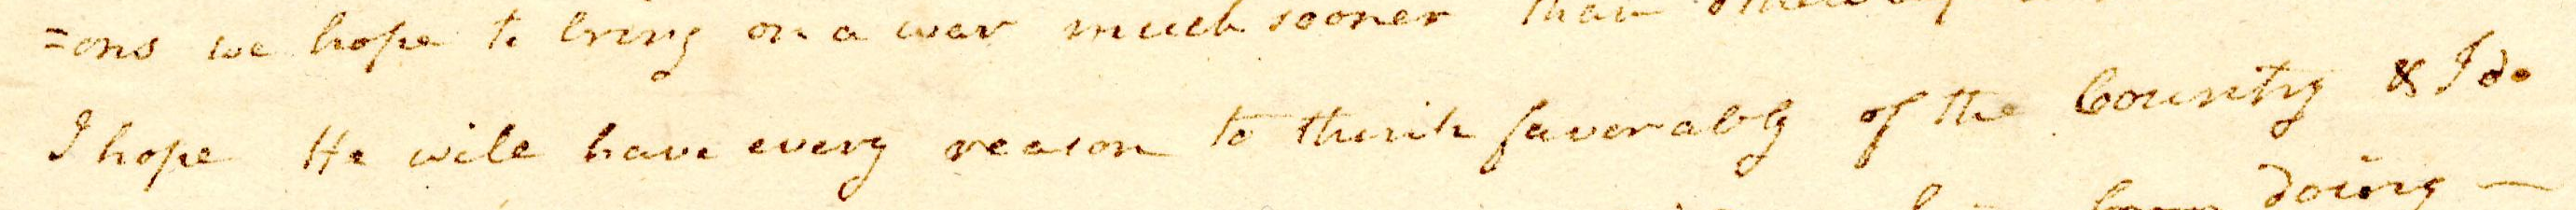I hope He will have every reason to think favorably of the Country & I do
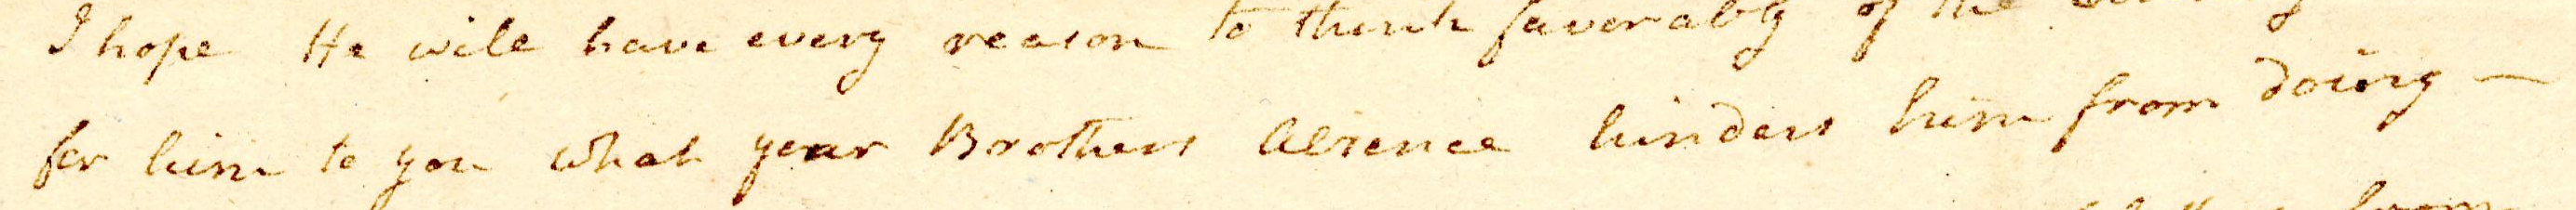for him to you what your Brothers absence hinders him from doing-
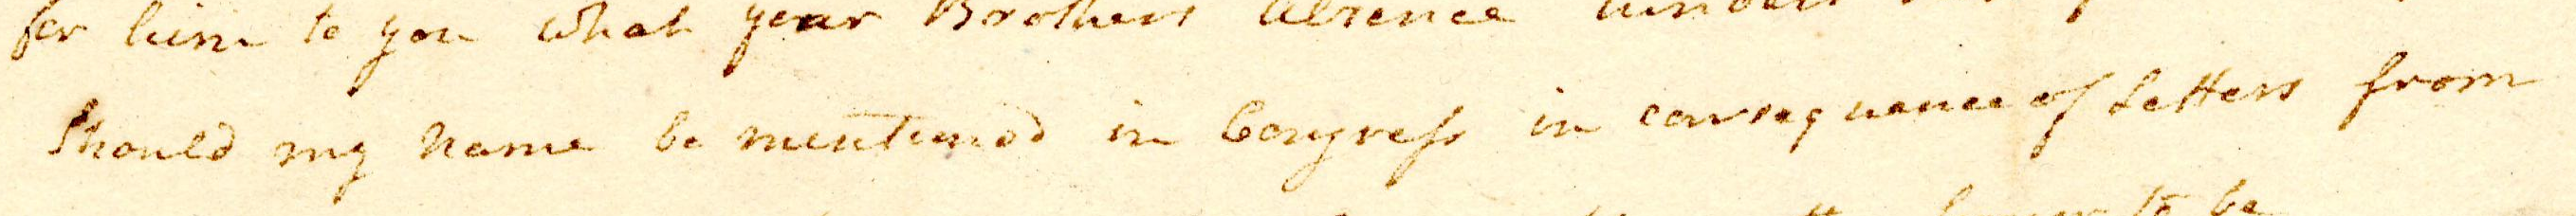should my name be mentioned in Congress in consequence of Letters from
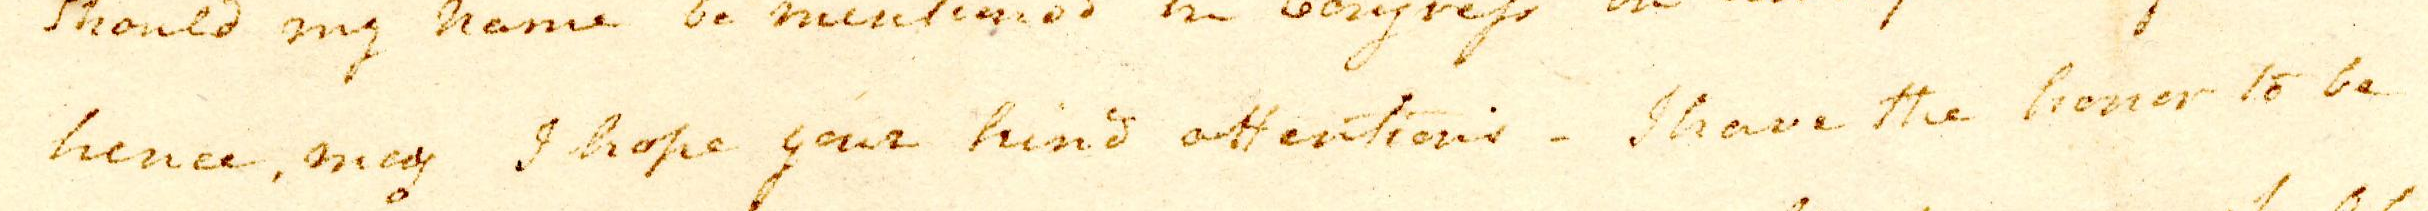hence, may I hope your kind attention's- I have the honor to be
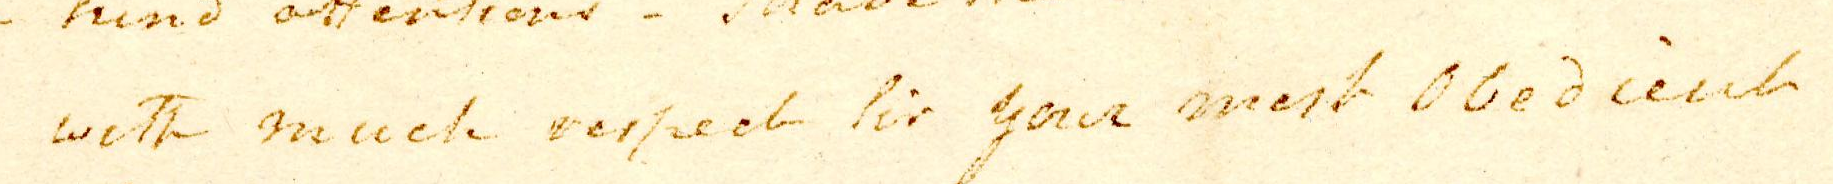with much respect sir your most obedient
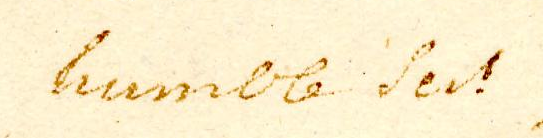humble Ser^t.
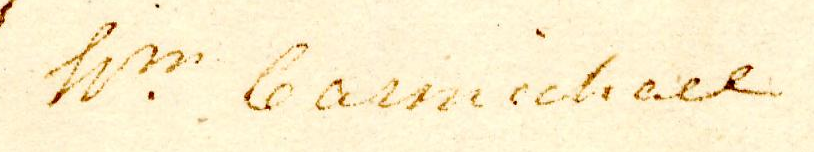W^m. Carmichael
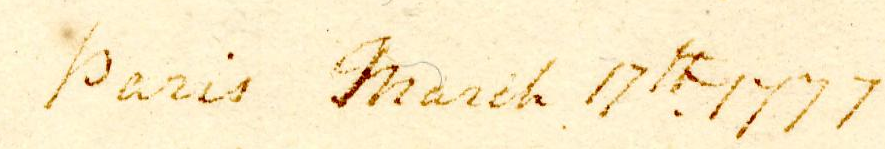Paris March 17^th. 1777
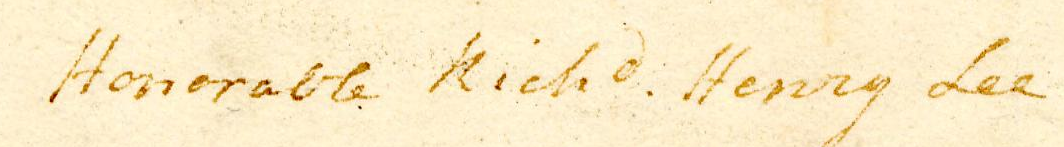Honorable Rich^d Henry Lee
